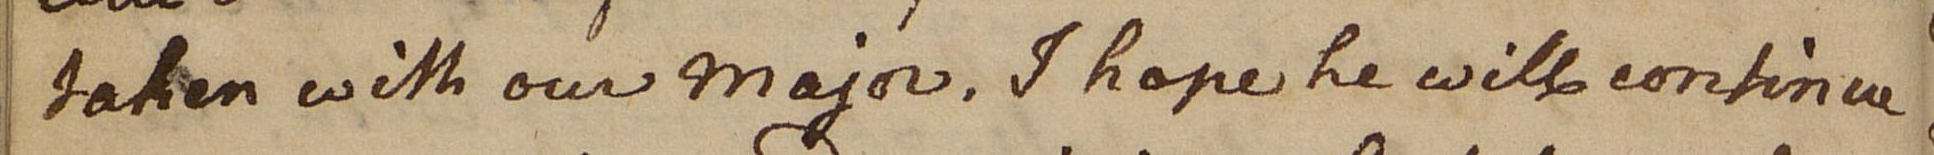taken with our Major. I hope he will continue
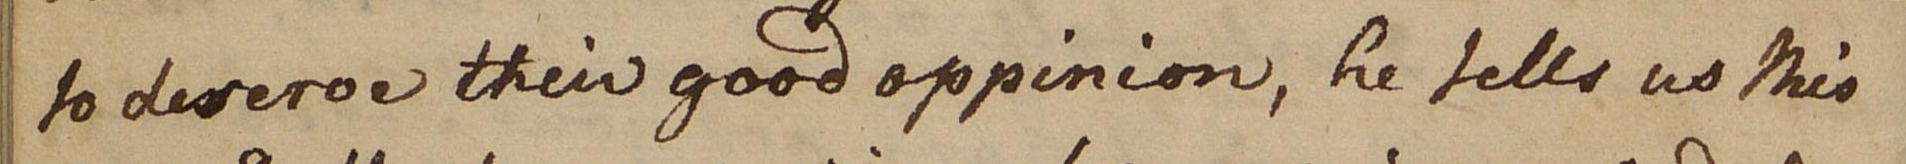to deserve their good oppinion, he tells us this
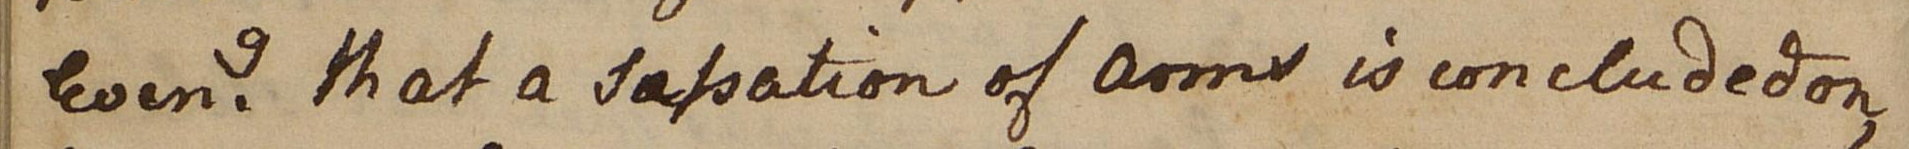Even^g. that a sassation of arms is concluded on,
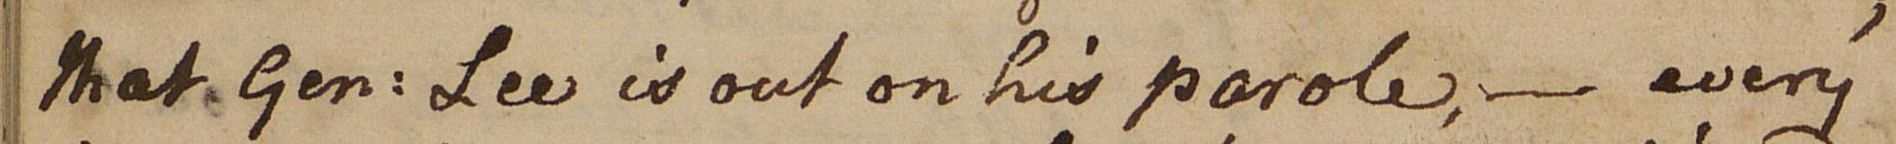that Gen: Lee is out on his parole,- every
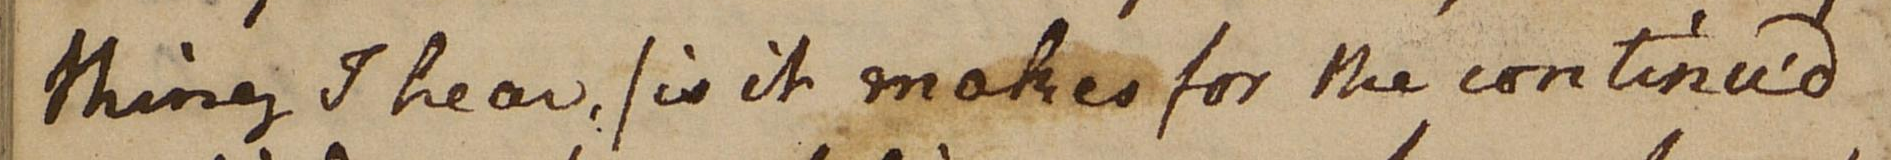thine I hear /is it makes for the continu'd
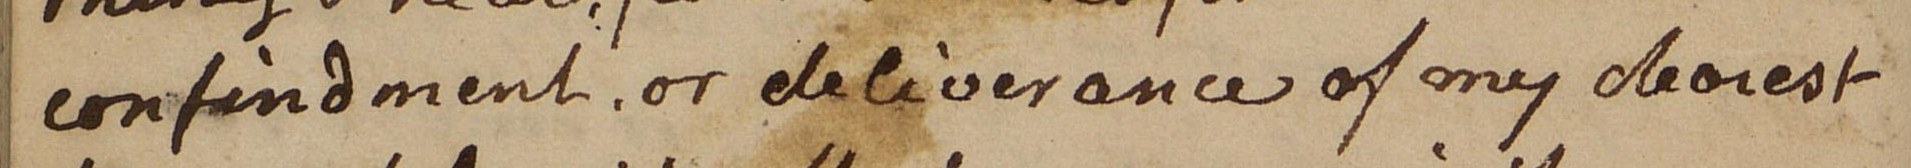confindment or deliverance of my dearest
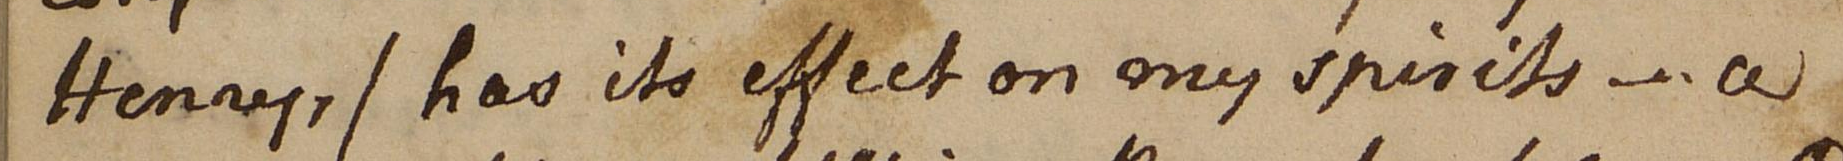Henry./ has its effect on my spirits- a
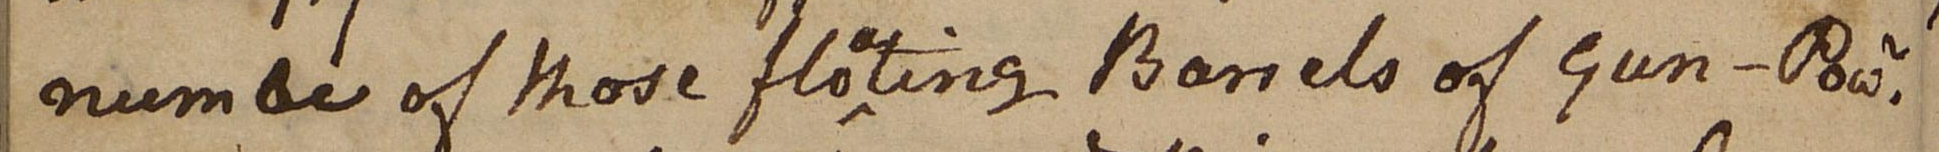numbe of those flo^ating Barrels of Gun- Pow^r.
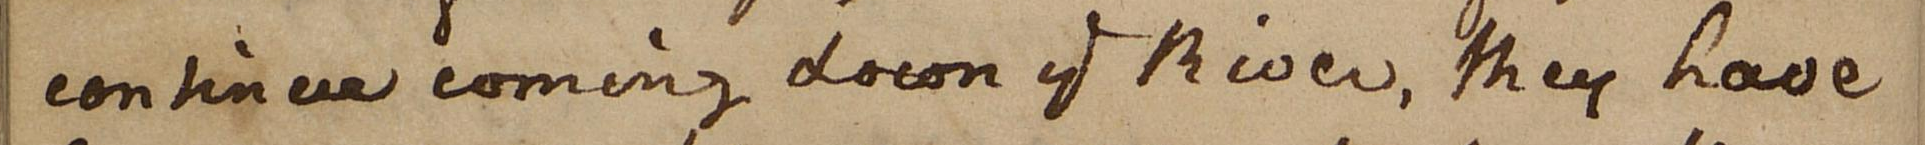continue coming down y^e River, they have
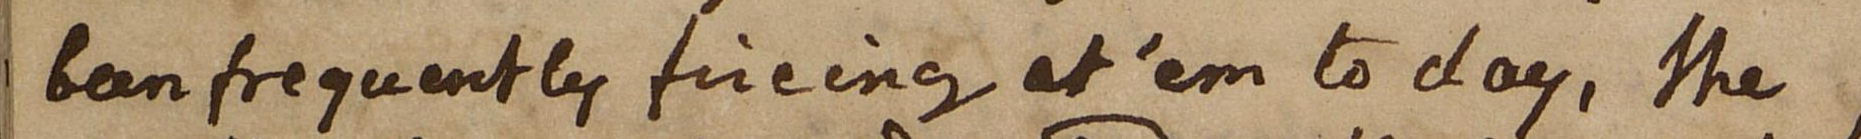been frequently fireing at 'em to day, the
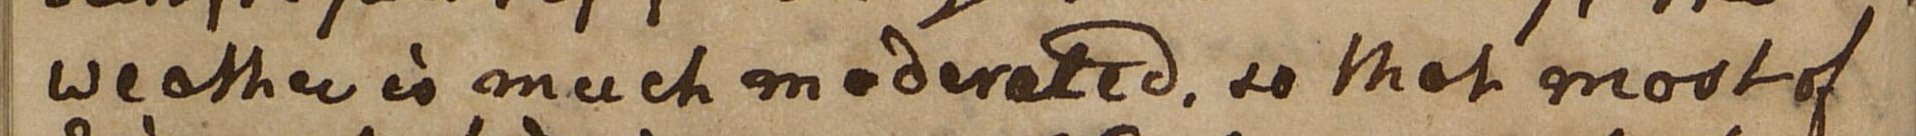weather is much moderated, so that most of
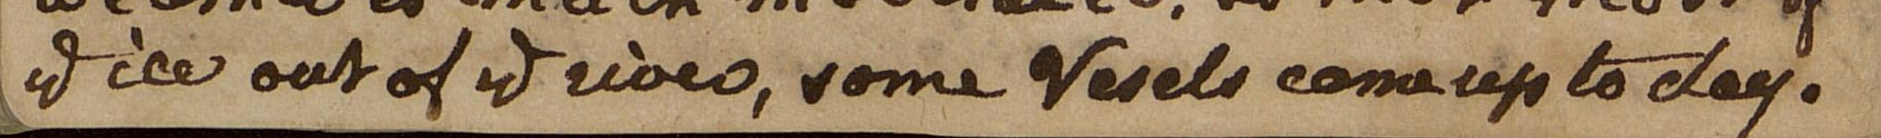y^e ice out of y^e river, some Vesels come up to day.
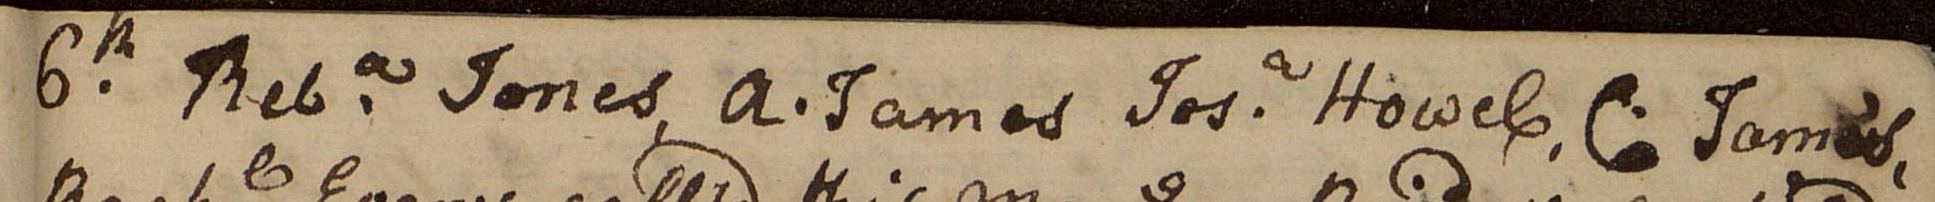6^th. Reb^a. Jones, A. James Jos^a. Howel, C James,
